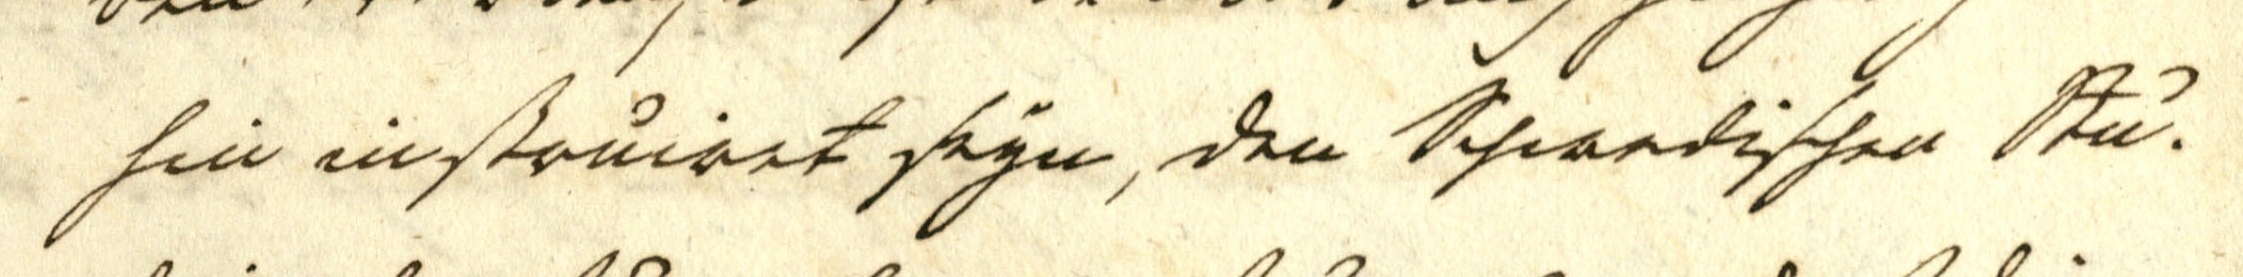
hin instruiret seÿn, den Schwedischen Stu¬
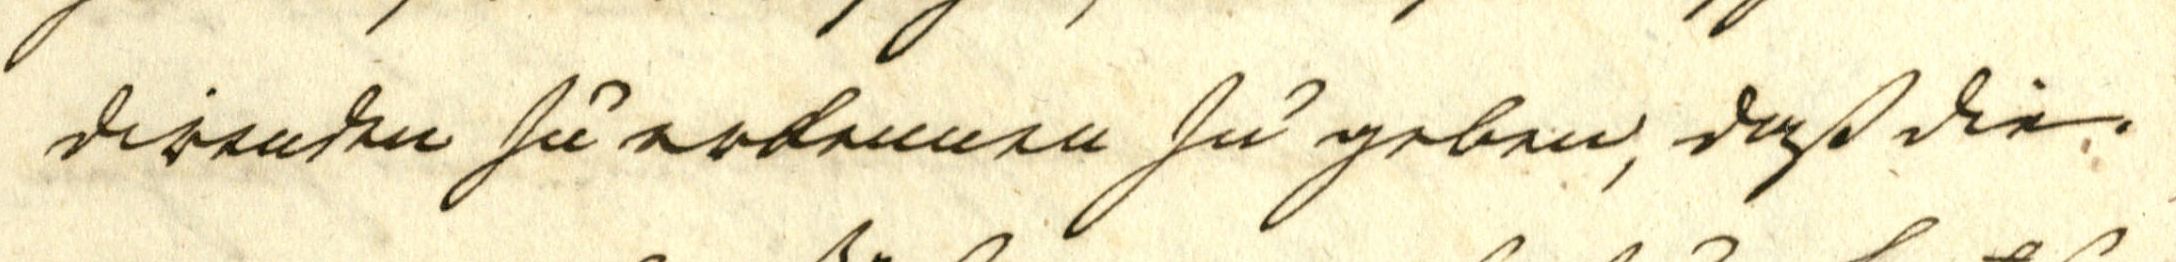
direnden zu erkennen zu geben, daß die¬
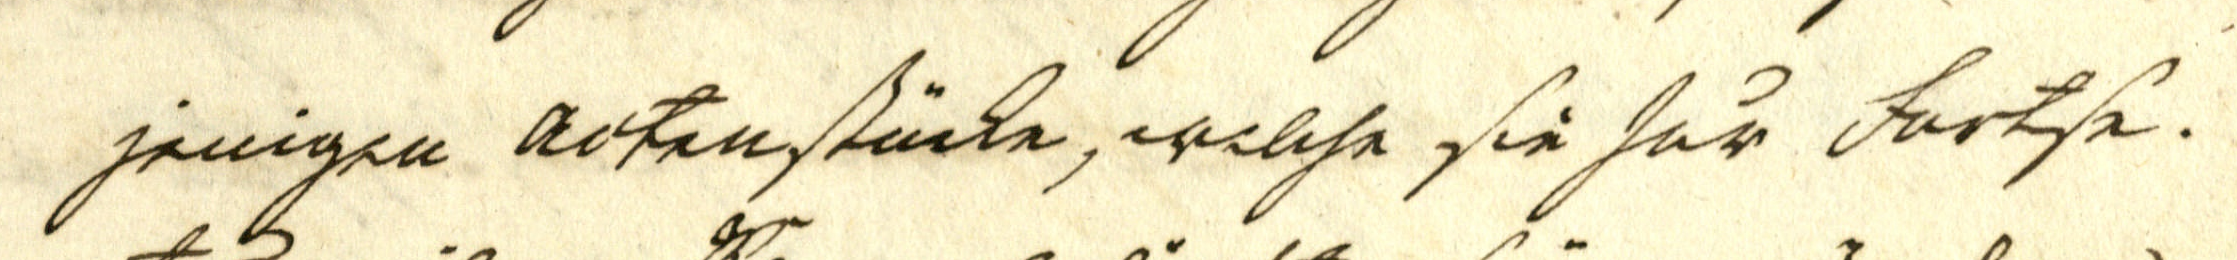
jenigen Actenstücke, welche sie zur Fortse¬
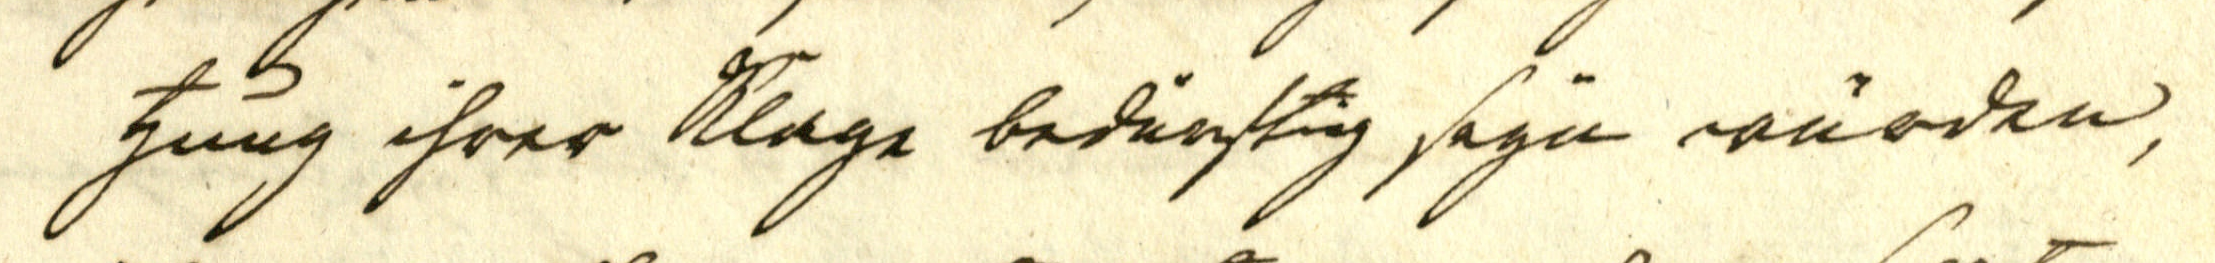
tzung ihrer Klage bedürftig seÿn würden,
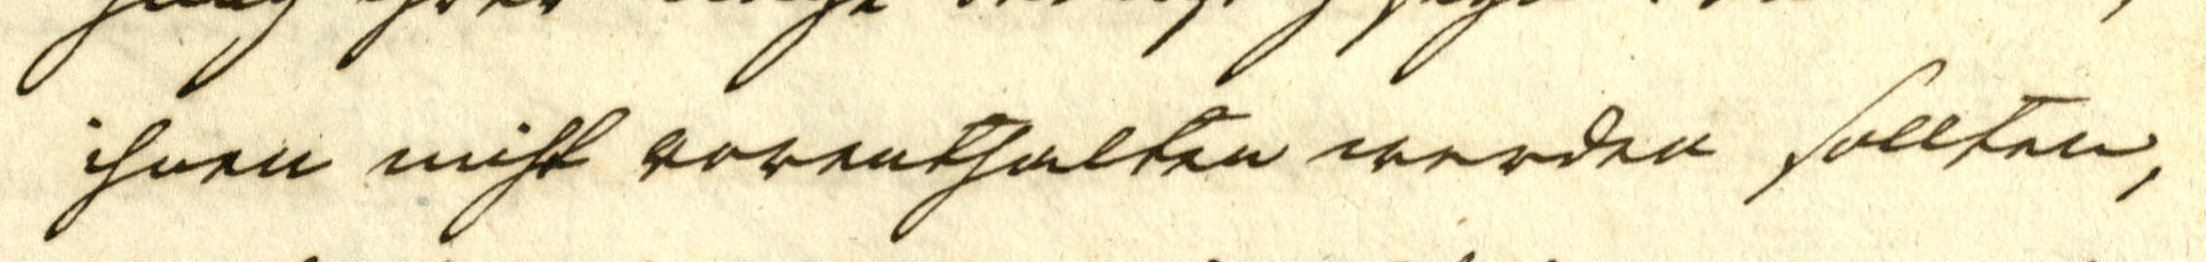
ihnen nicht vorenthalten werden sollten,
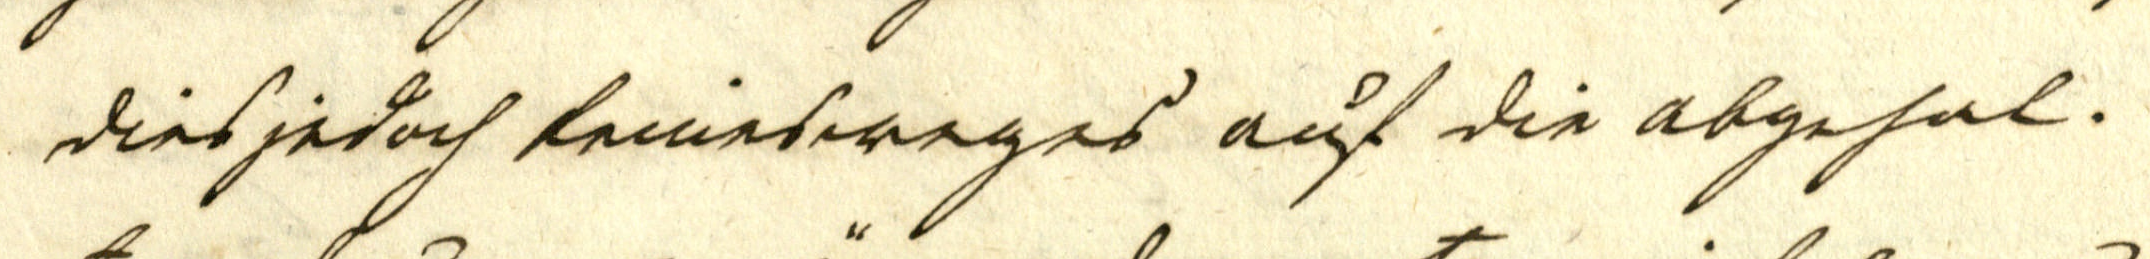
dies jedoch keinesweges auf die abgehal¬
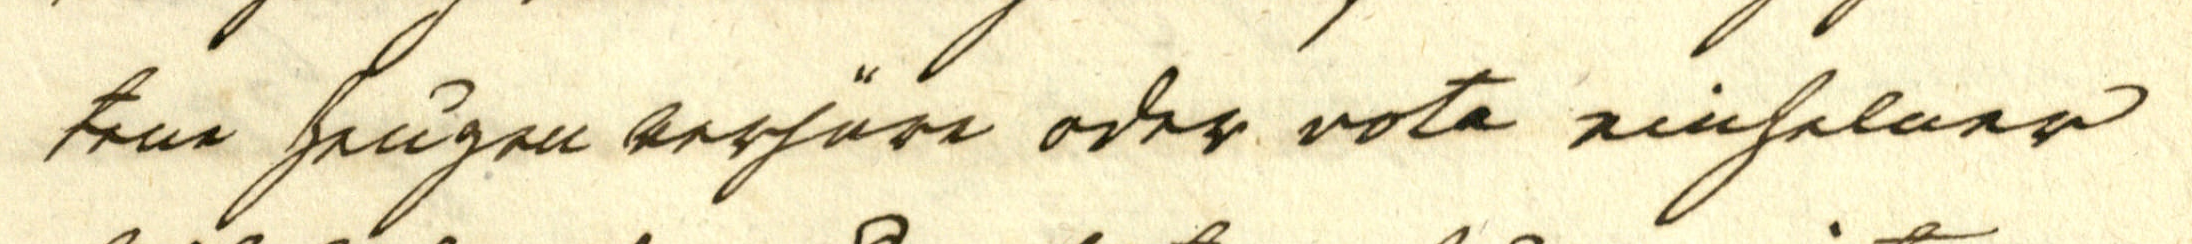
tene Zeugen verhöre der vota einzelner
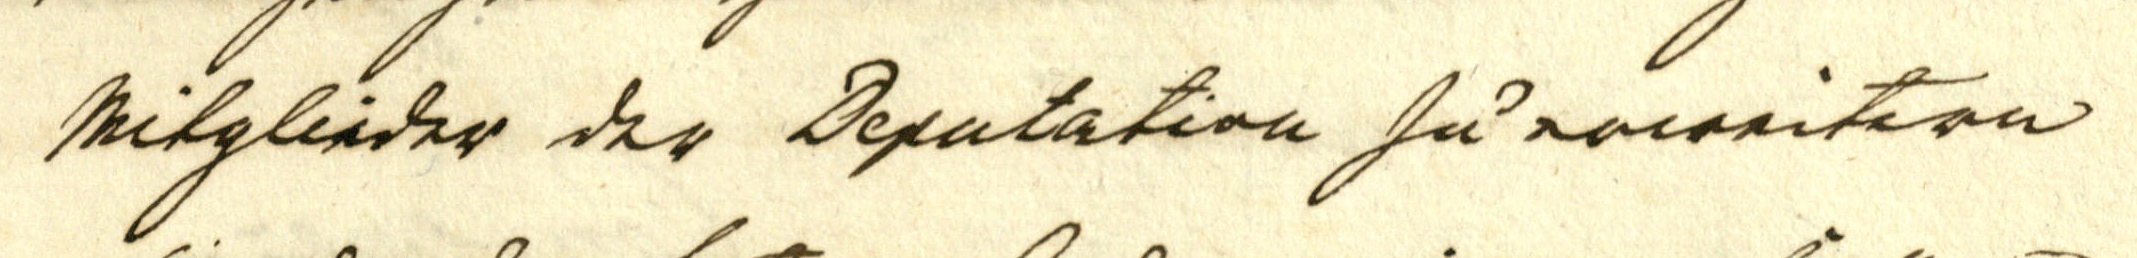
Mitglieder der Deputation zu erweitern
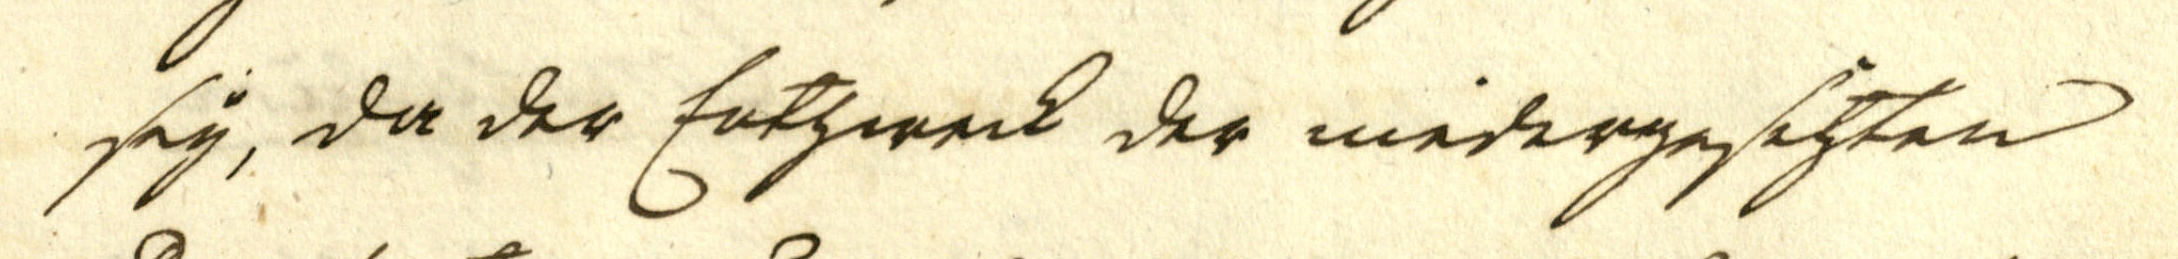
seÿ, da der Entzweck der niedergesetzten
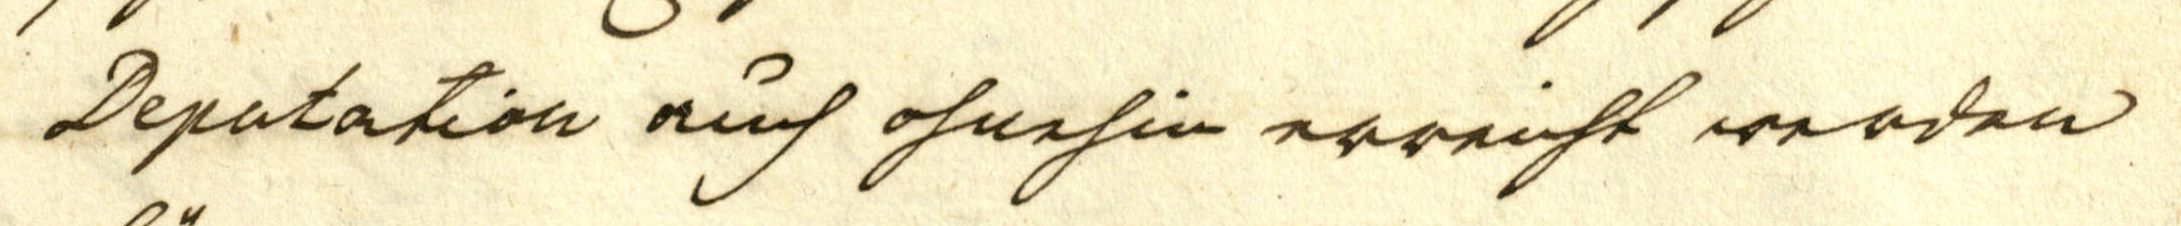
Deputation auch ohnehin erreicht werden
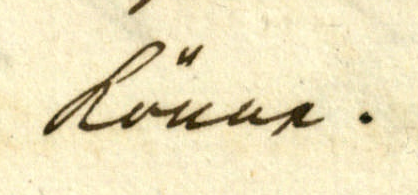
könne.
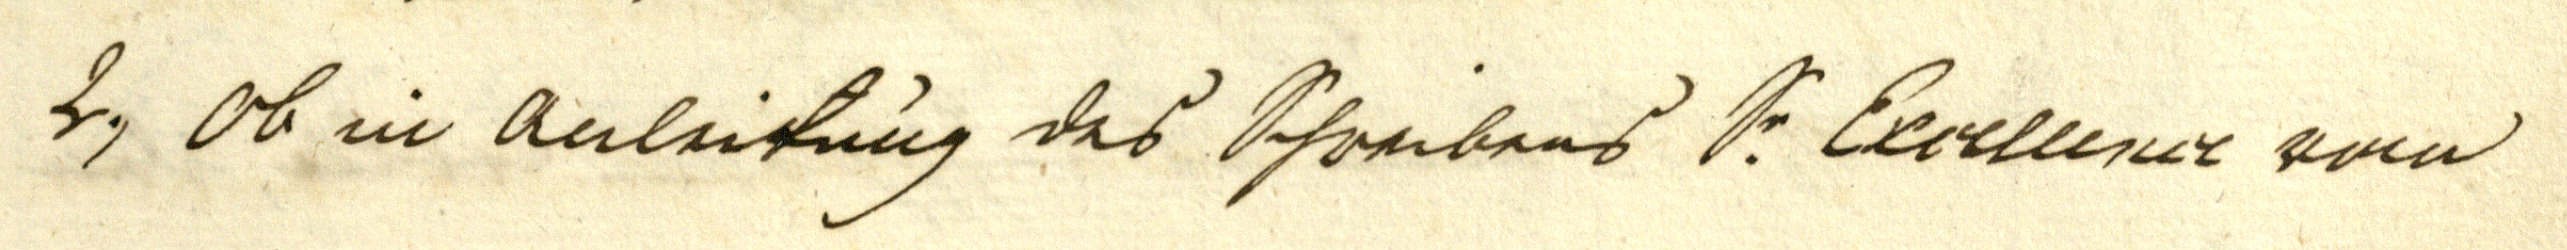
2., Ob in Anleitung des Schreibens Sr Excellence vom
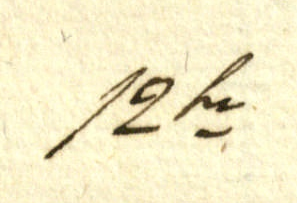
12t.
